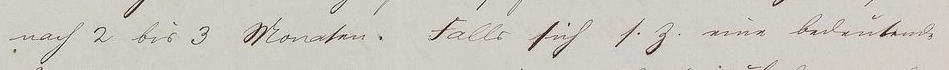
nach 2 bis 3 Monaten. Falls sich s. Z. eine bedeutende
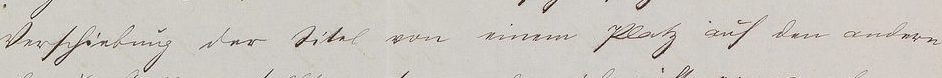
Verschiebung der Titel von einem Platz auf den andern
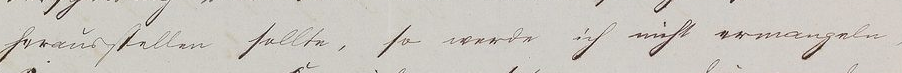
herausstellen sollte, so werde ich nicht ermangeln,
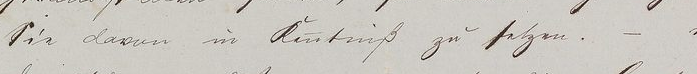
Sie davon in Kenntniß zu setzen. – Die
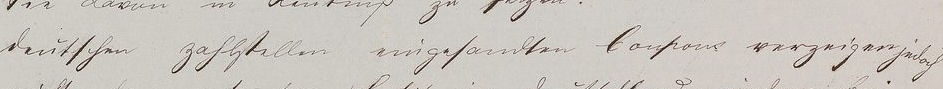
deutschen Zahlstellen eingesandten Coupons verzeigen jedoch
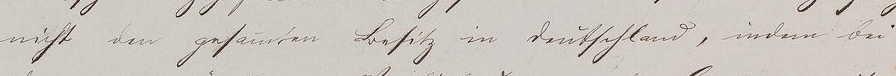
nicht den gesammten Besitz in Deutschland, indem bei
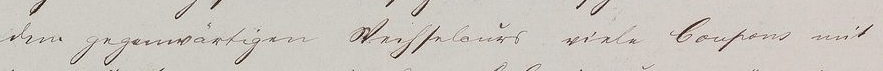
dem gegenwärtigen Wechselcurs viele Coupons mit
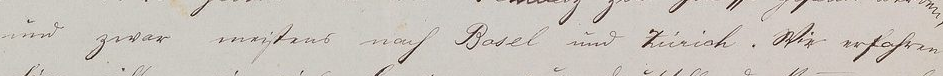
und zwar meistens nach Basel und Zürich. Wir erfahren
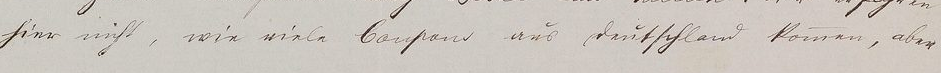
hier nicht, wie viele Coupons aus Deutschland kommen, aber
